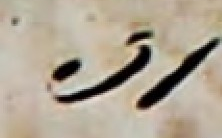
51
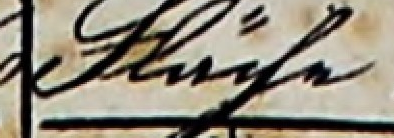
Fläche
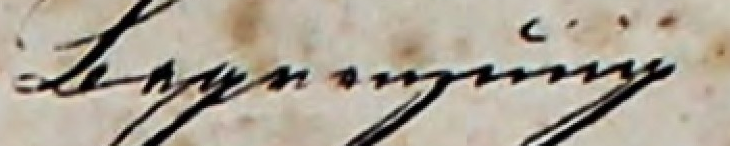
Begrenzung
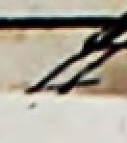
J,
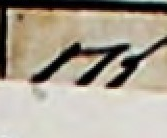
CK.
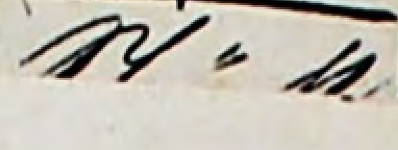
???
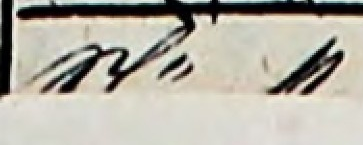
???
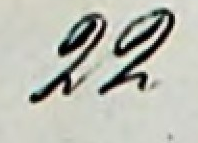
22
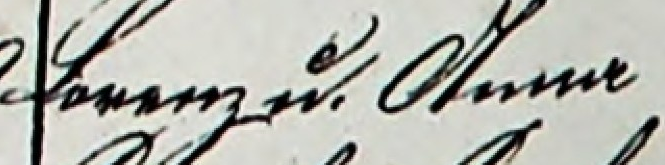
Lorenz u. Anna
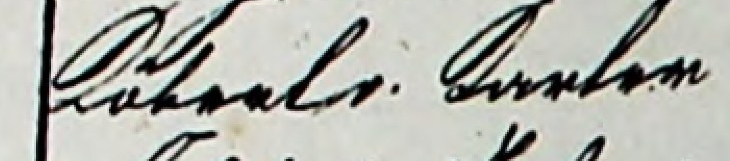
Köberle. Karler
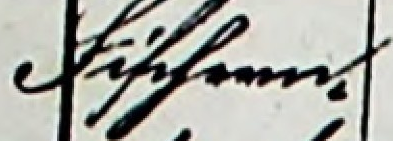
Fischern„
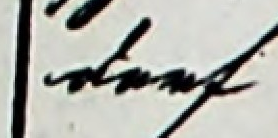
dorf
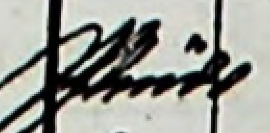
Pflinds
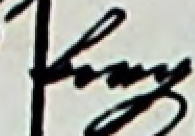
berg
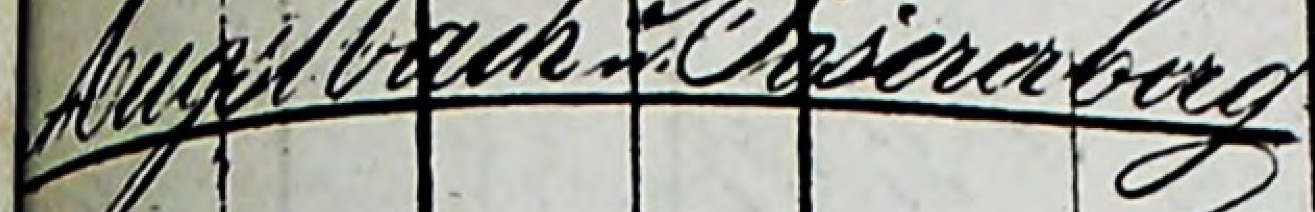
Augstbach u. Posererberg
